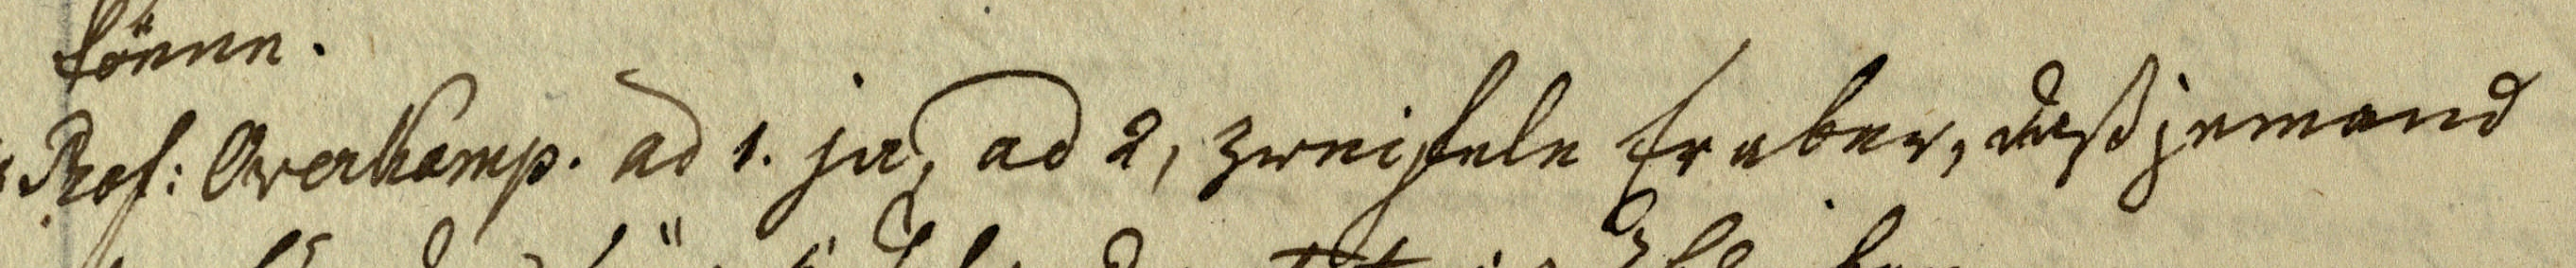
dh Prof. Overkamp an 1. ad 2, zweifele Er aber, daß jemand
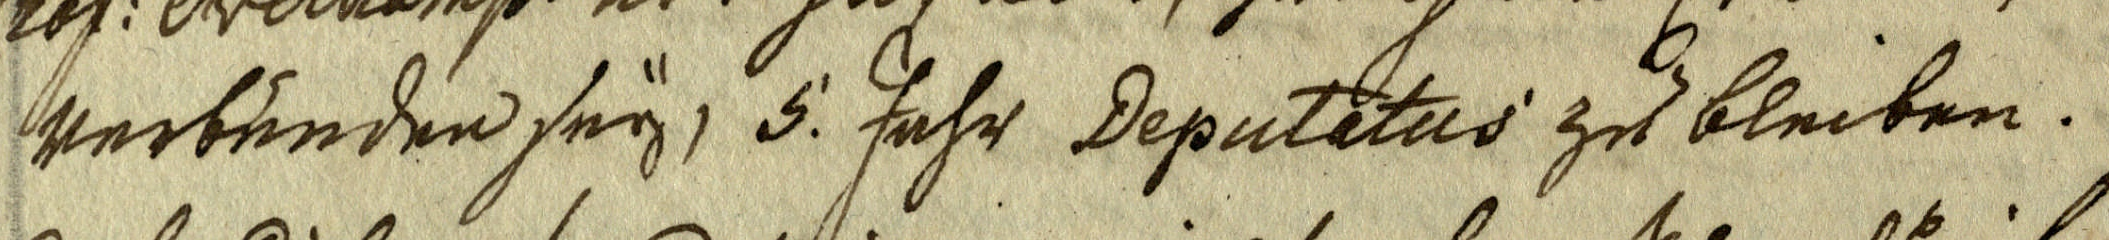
verbunden seÿ, 5. Jahr Deputatus zu bleiben.
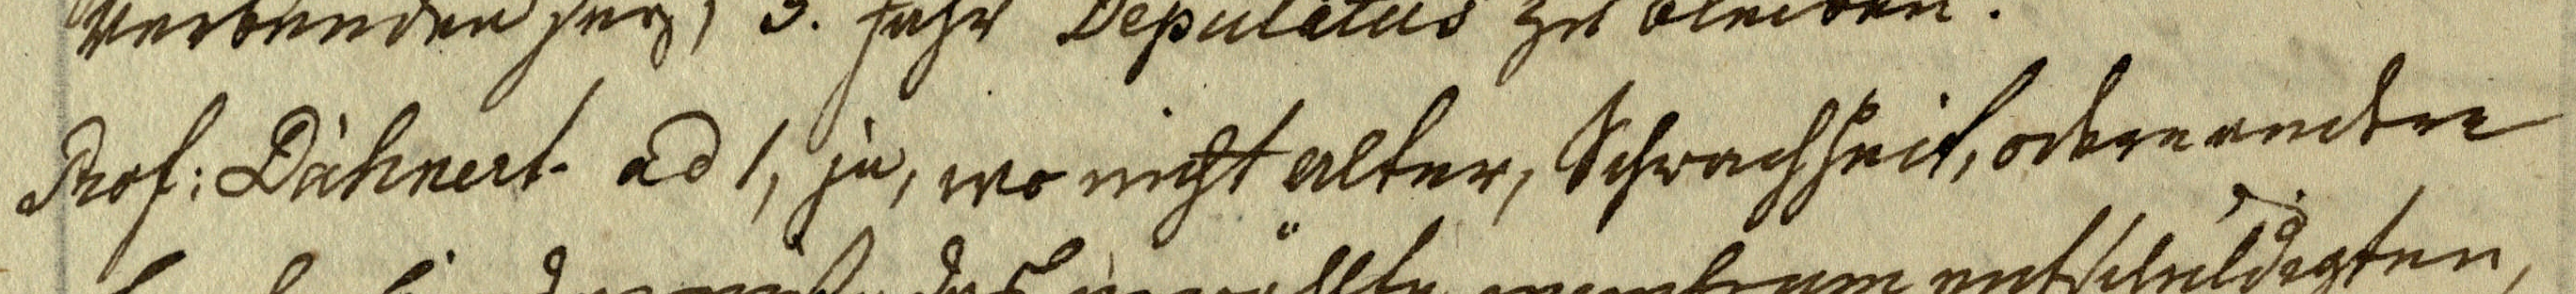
Prof. Dähnert. ad 1, ja, wo nicht Alter Schwachheit, oder andere
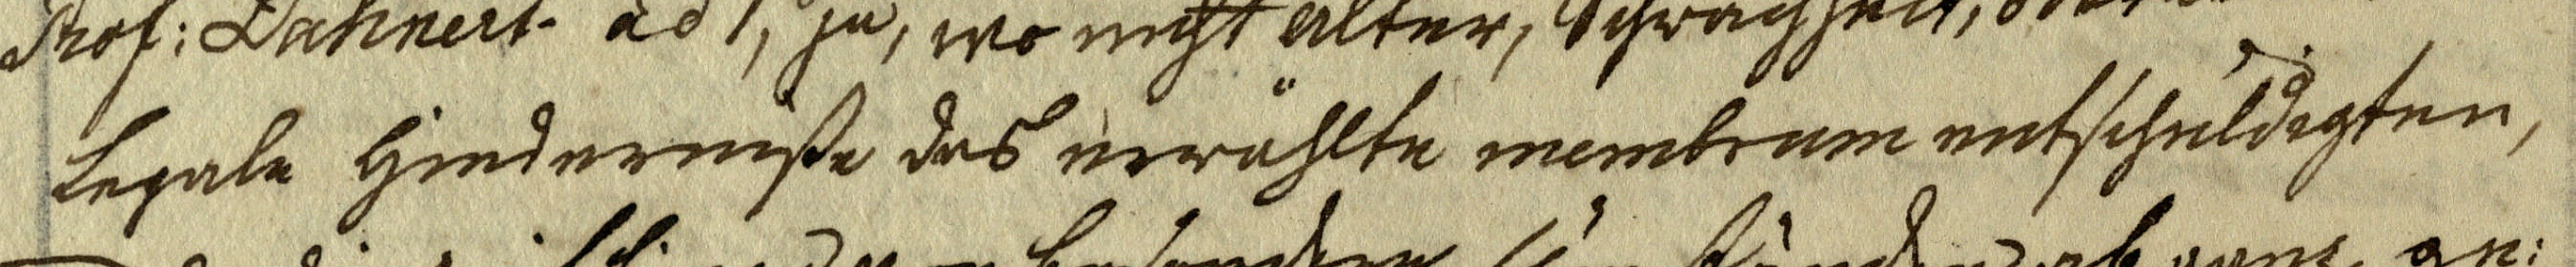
Legale Hinderniße das erwählte membrum entschuldigten,
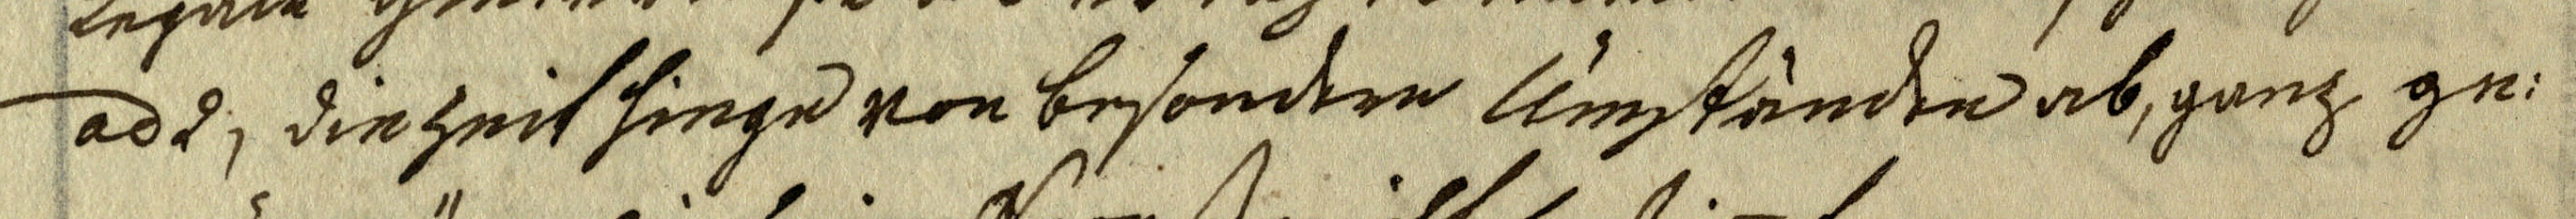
ad 2, die Zeit hinge von besondern Umständen ab, ganz ge¬
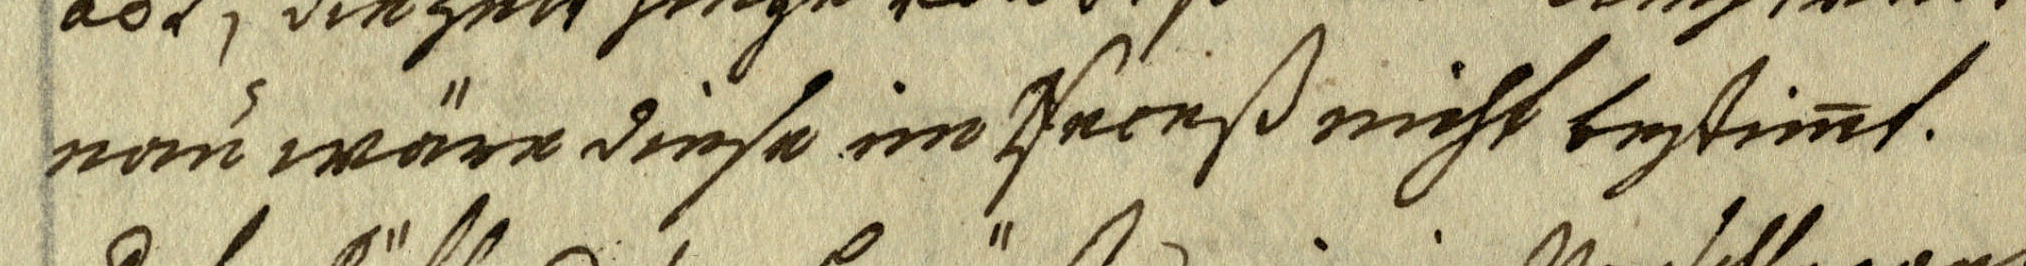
nau wäre diese im Receß nicht bestimt.
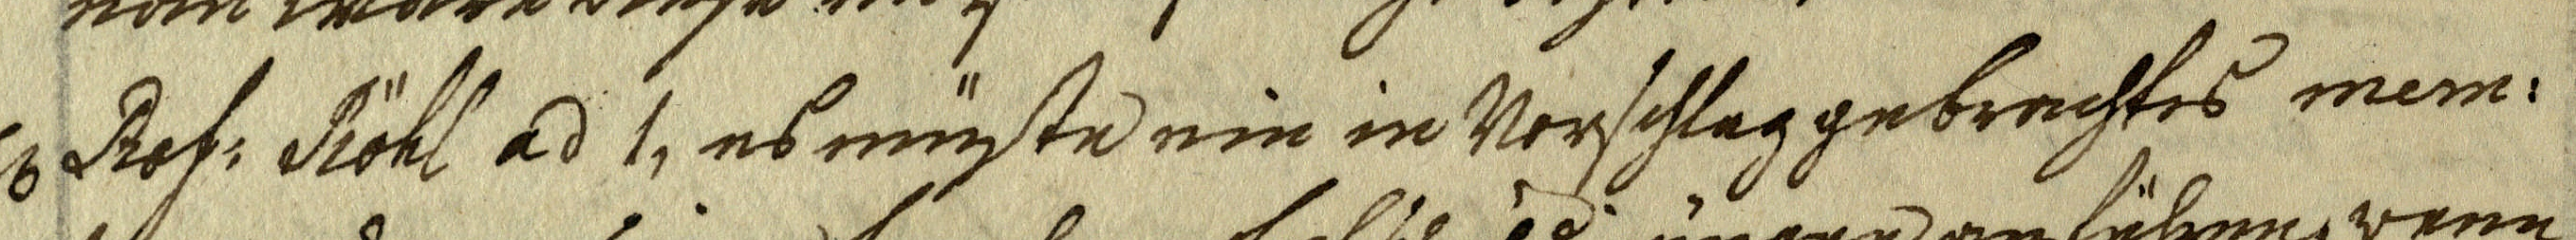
dh Prof. Röhl. ad. 1. es müßte ein in Vorschlag gebrachtes mem¬
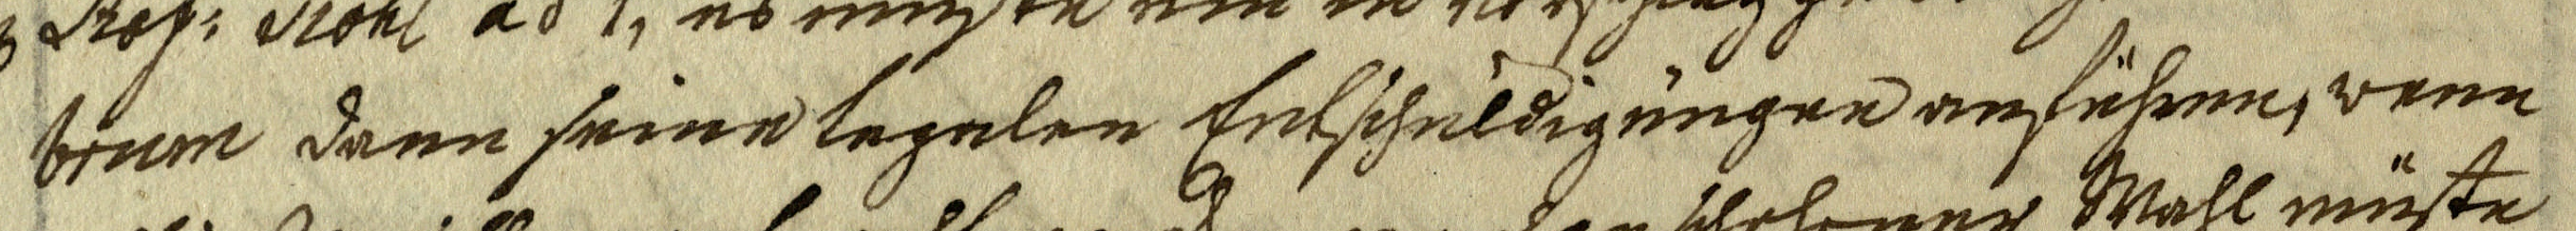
brum dann seine legalen Entschuldigungen anführen, wenn
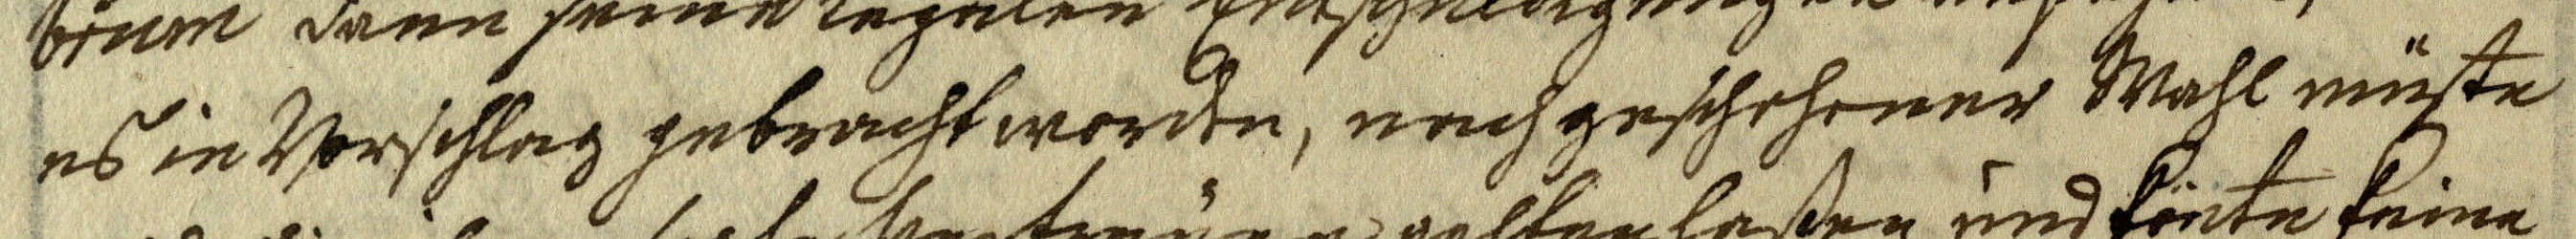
es in Vorschlag gebracht worden, nach geschehener Wahl müßte
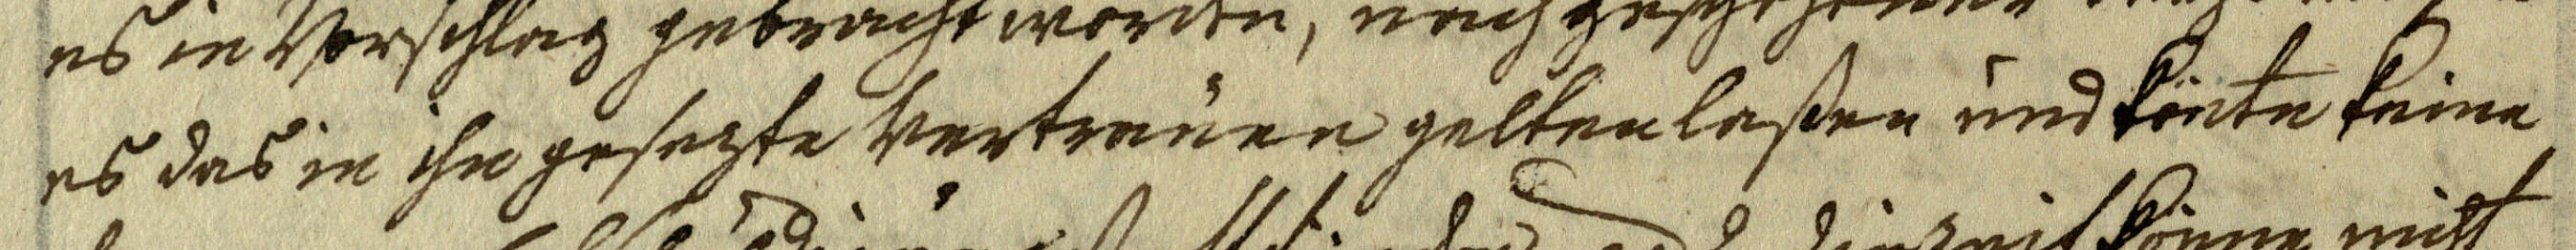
es das in ihn gesezte Vertrauen geltenlaßen und könte keine
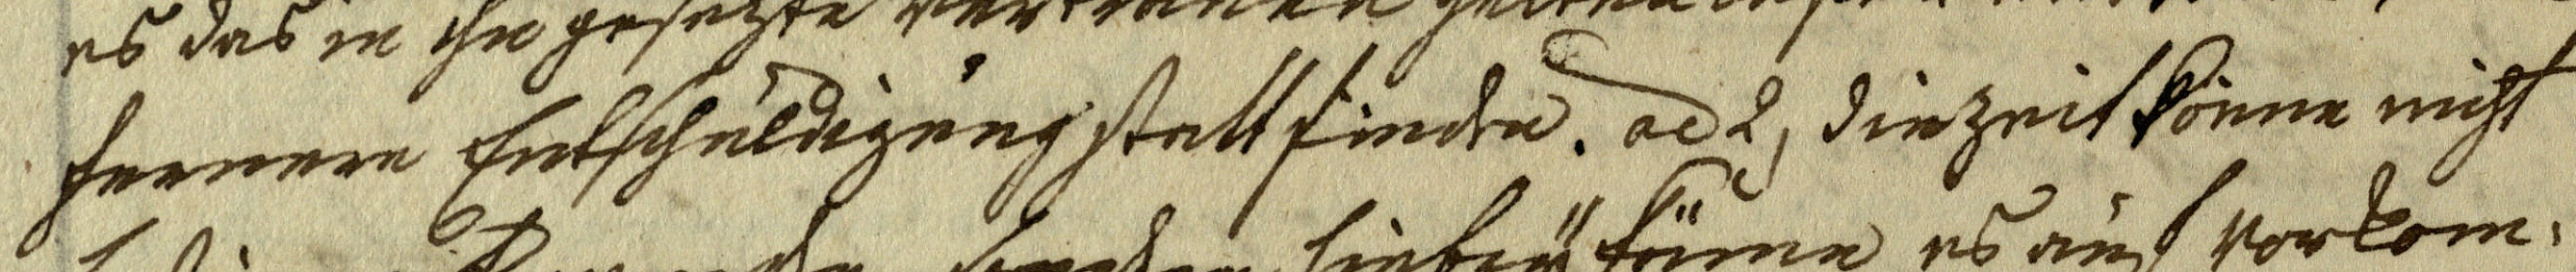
fernere Entschuldigung statt finden. ad 2, die Zeit könne nicht
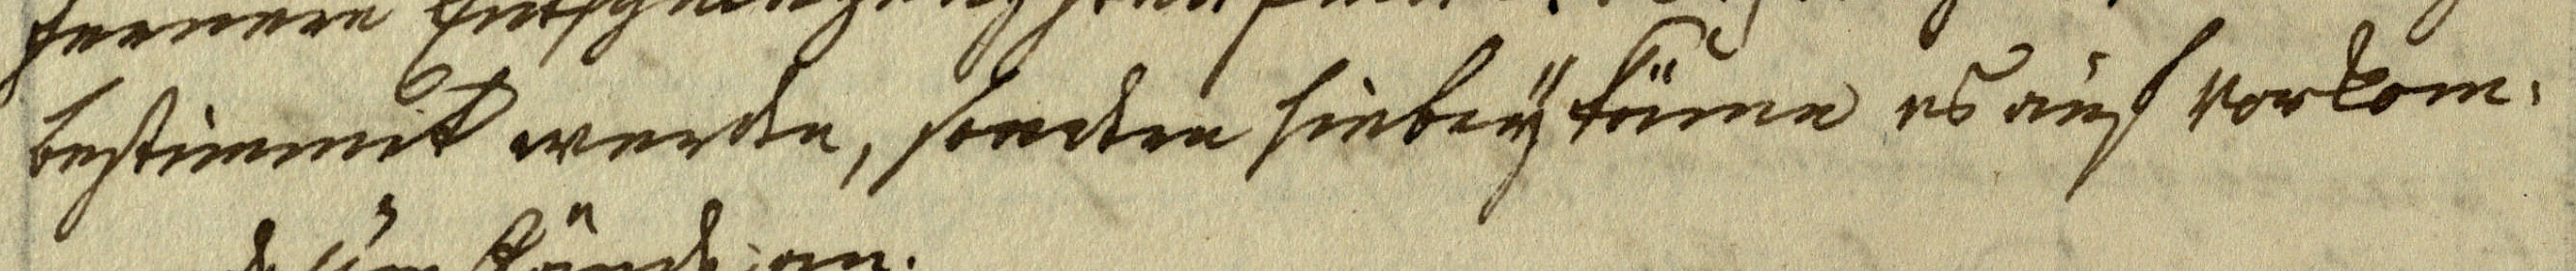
bestimmet werden, sondern hiebeÿ käme es auf vorkom¬
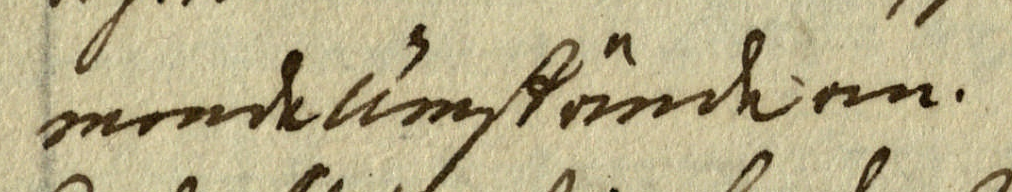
mende Umstände an.
